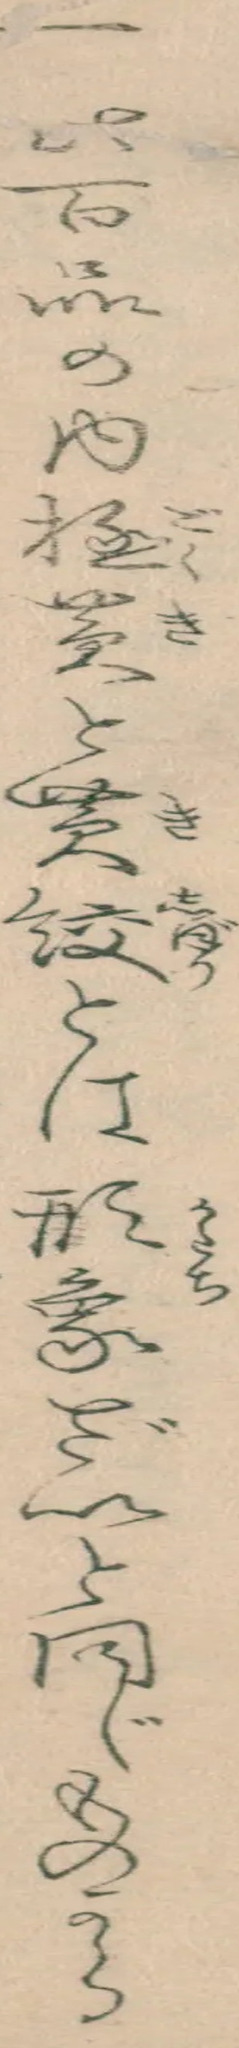一此百品の内極黄と黄絞とは形象ざいと同じものから
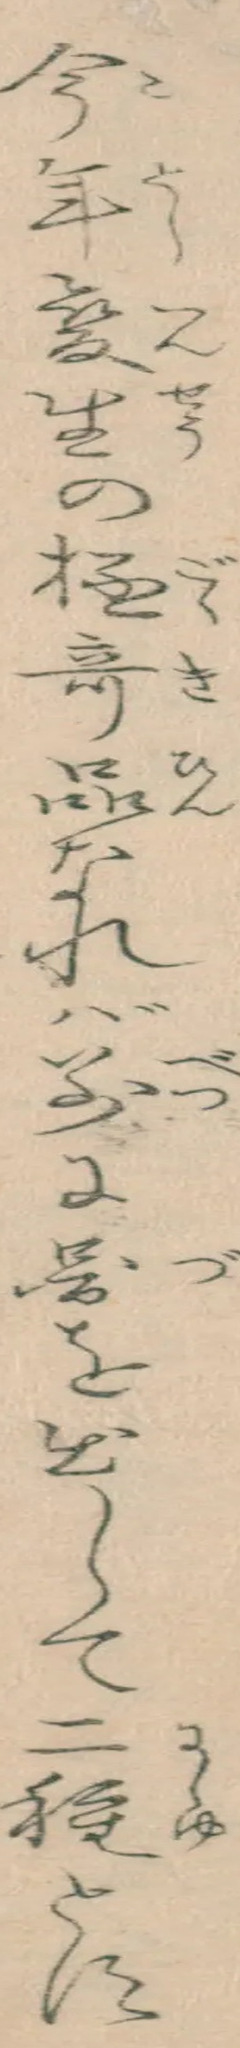今年変生の極奇品なれば別に図を出して二種とす
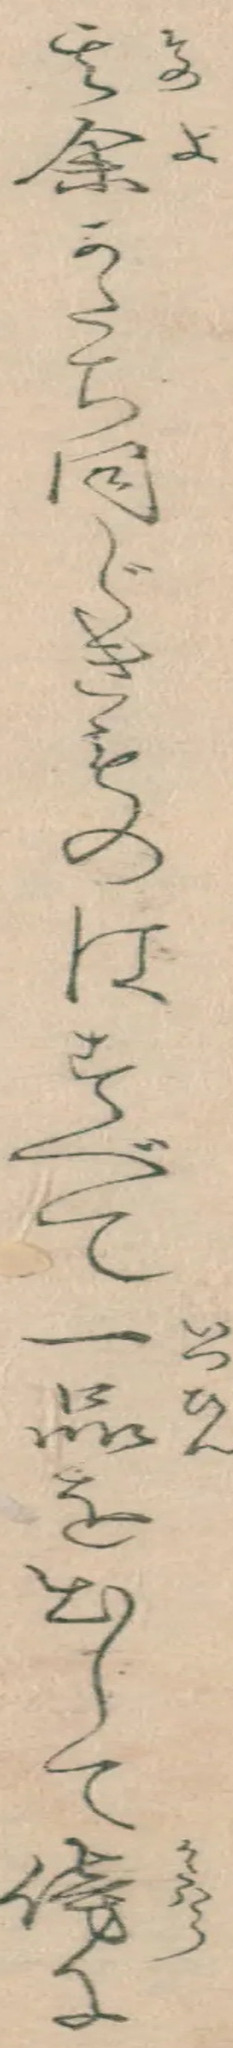其余かたち同じきものはすべて一品を出して傍に
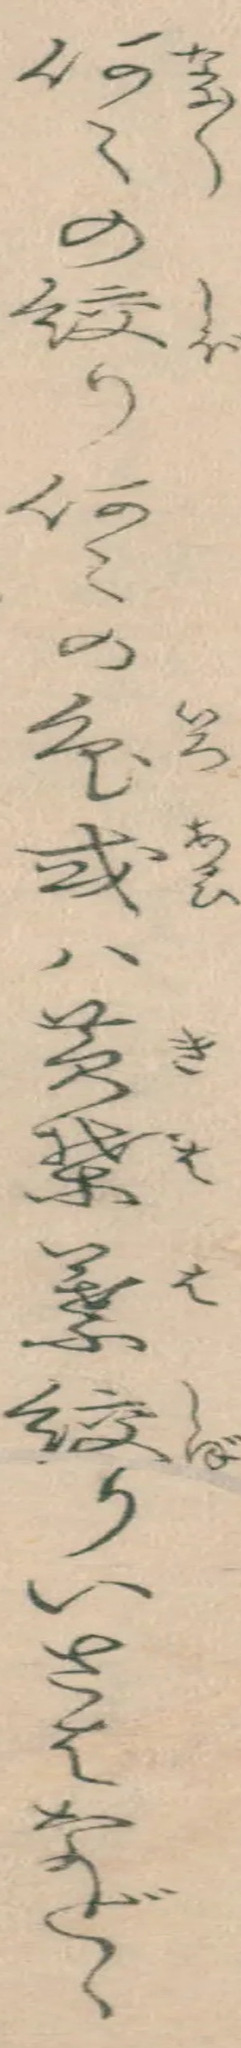何々の絞り何々の色或は黄葉葉絞りいさはなどゝ
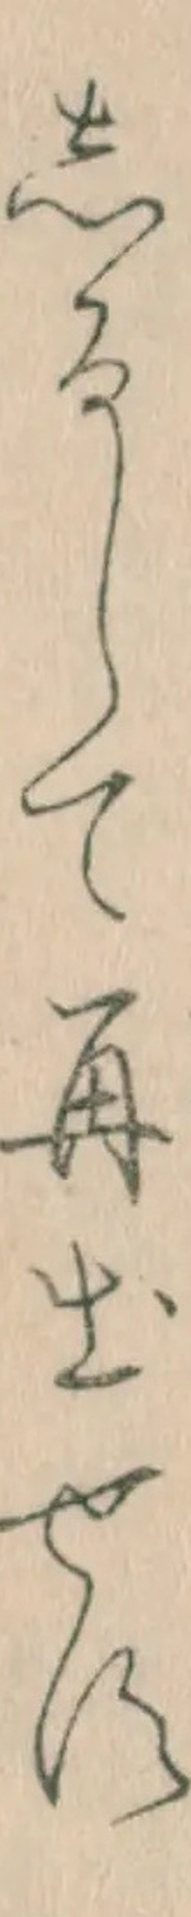しるして再出せす
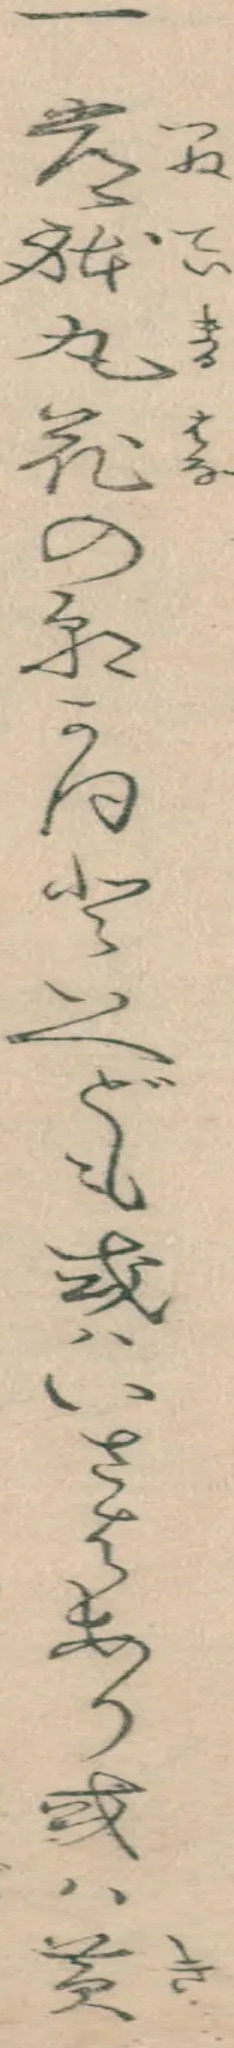一常体丸花の朝かほといへども或はいさはあり或は黄
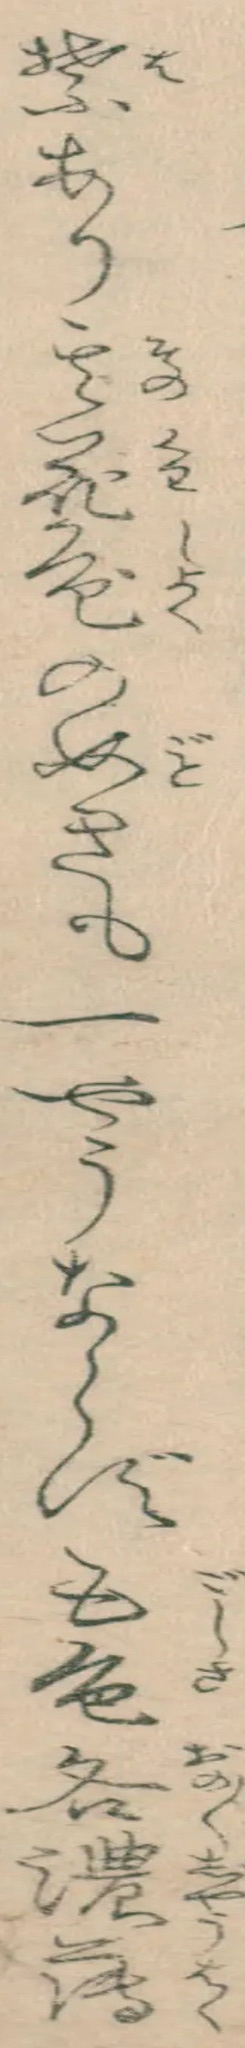葉あり其花色の如きも一やうならず五色各濃薄
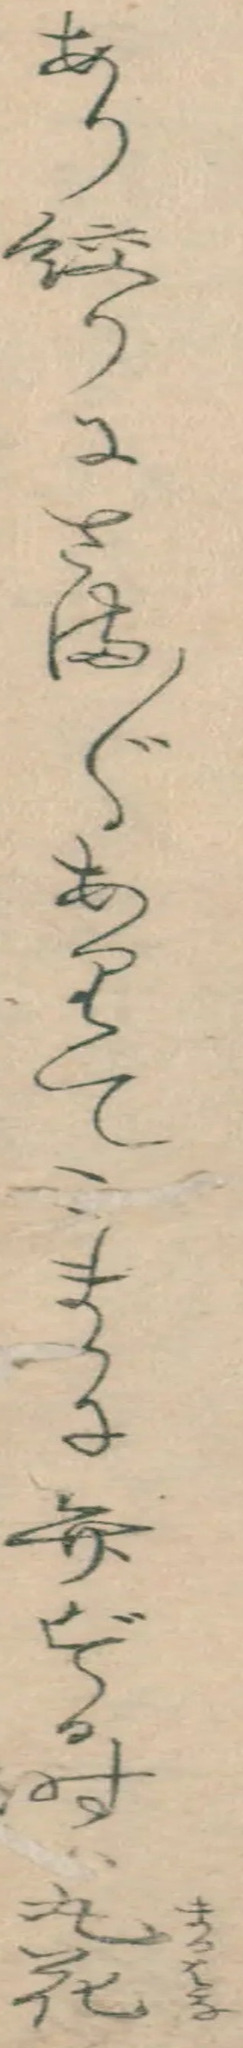あり絞りにさま〴〵ありてこまかに弁ずる時は丸花

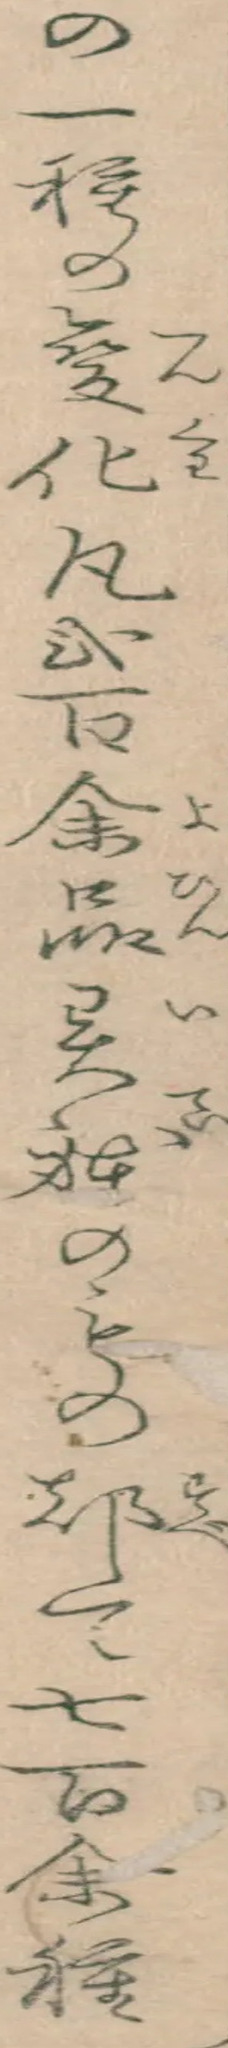の一種の変化凡弐百余品異体のもの都て七百余種
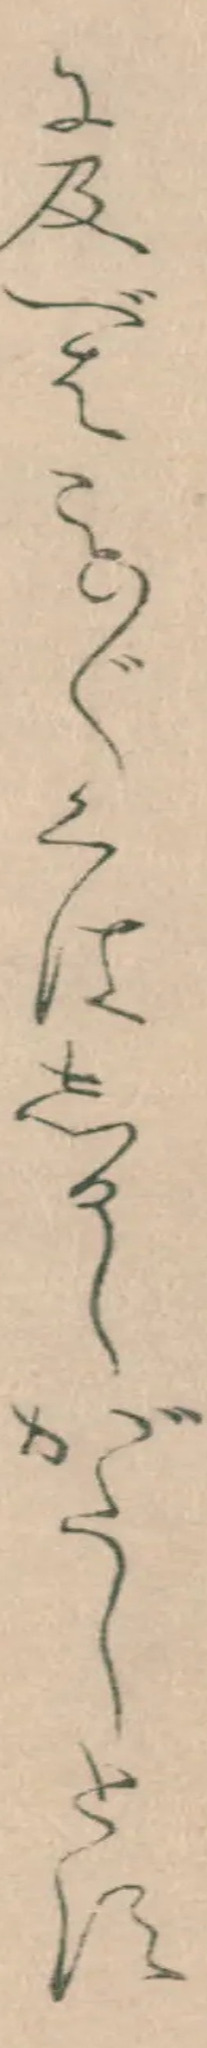に及べはこと〴〵くはしるしがたしとす
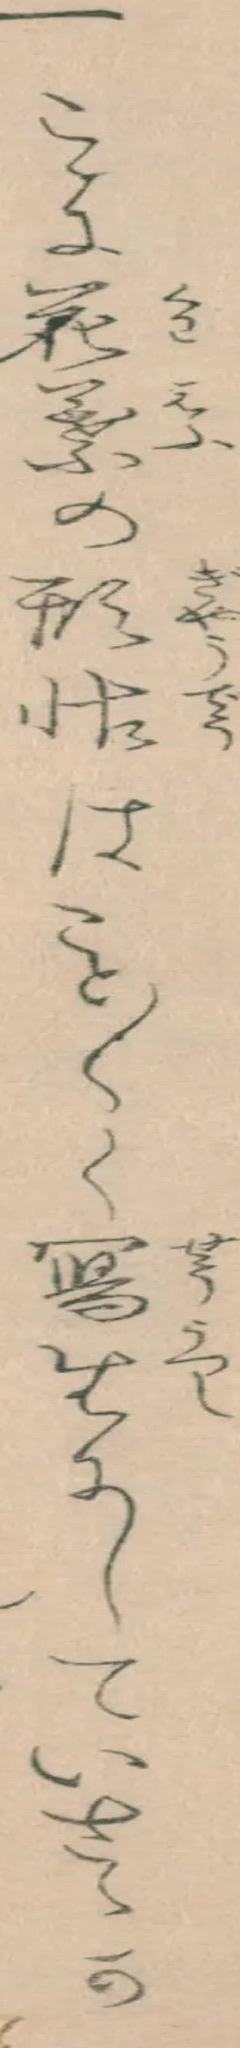一こゝに花葉の形情はこと〳〵く写生にしていさゝか
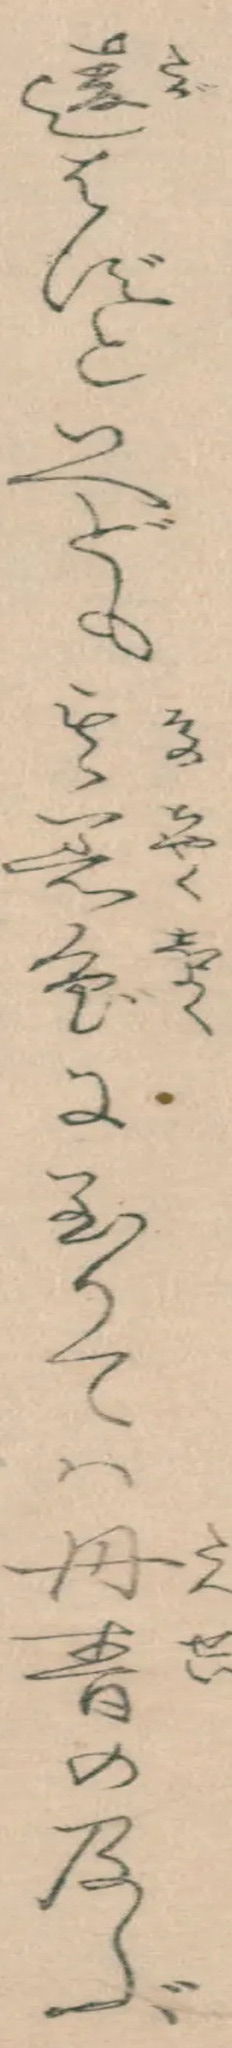違はずといへども其着色に至りては丹青の及ぶ
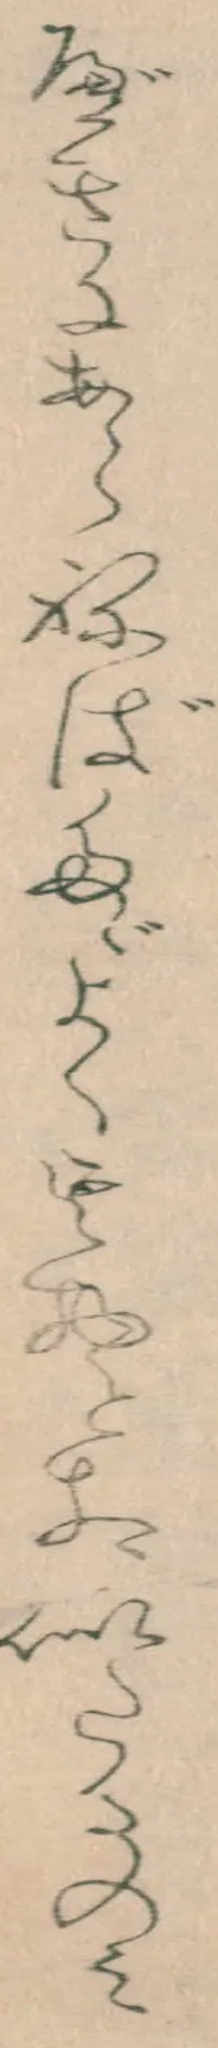べきにあらねばたゞよく其物と相似たるのみ
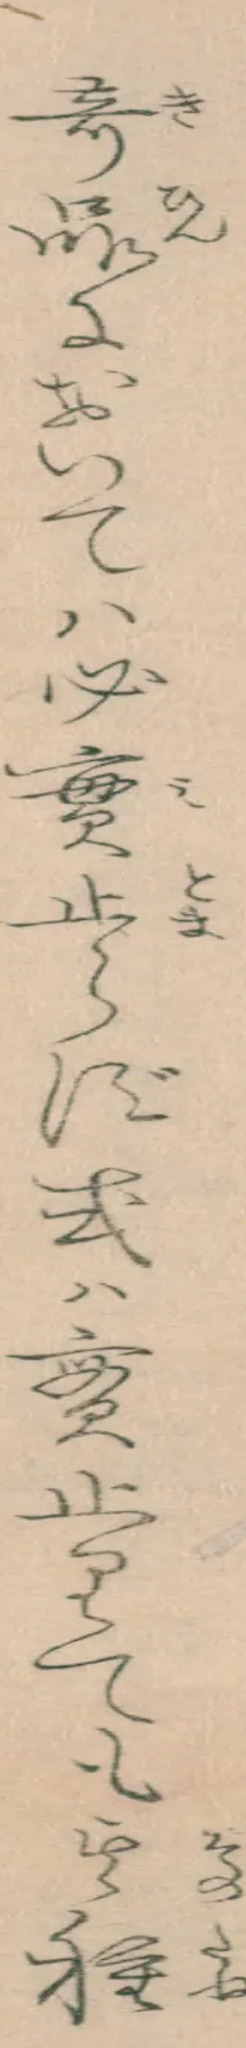一奇品においては必実止らず或は実止りても其種
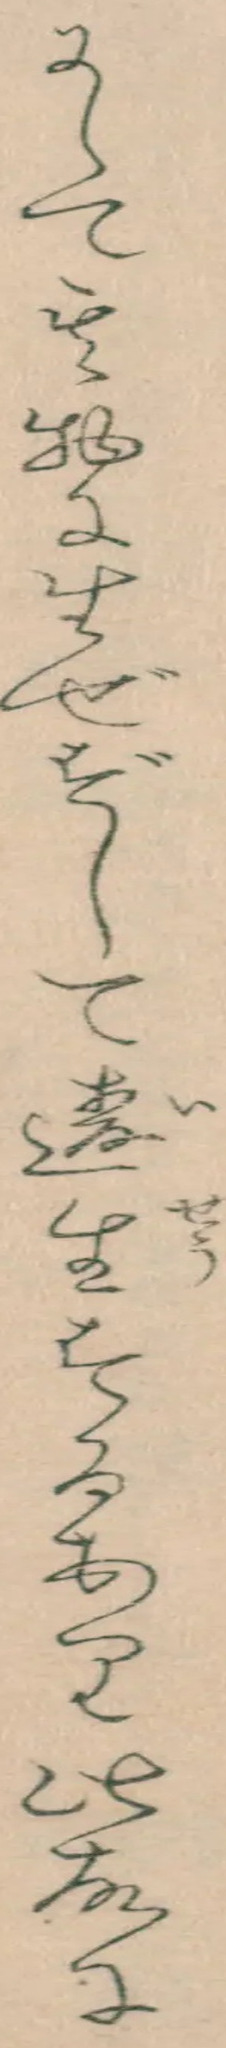にして其物に生ぜずして違生するあり此故に
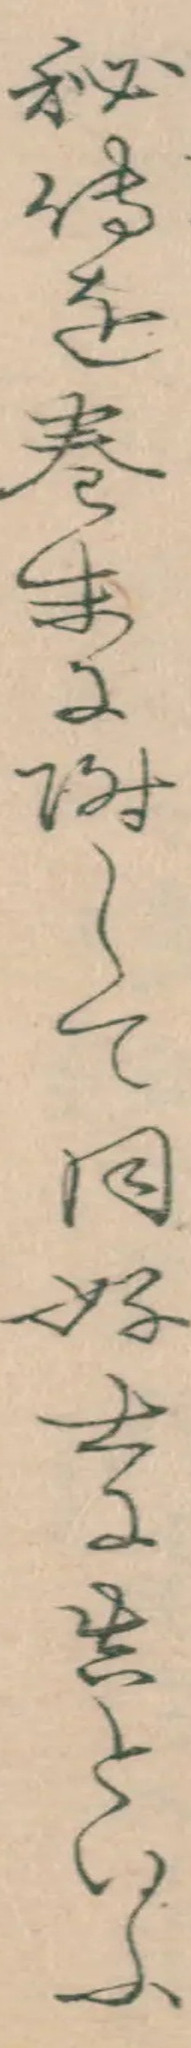秘伝を巻末に附して同好士に告といふ
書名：朝顔叢. 上巻
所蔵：国立国会図書館 National Diet Library, JAPAN
